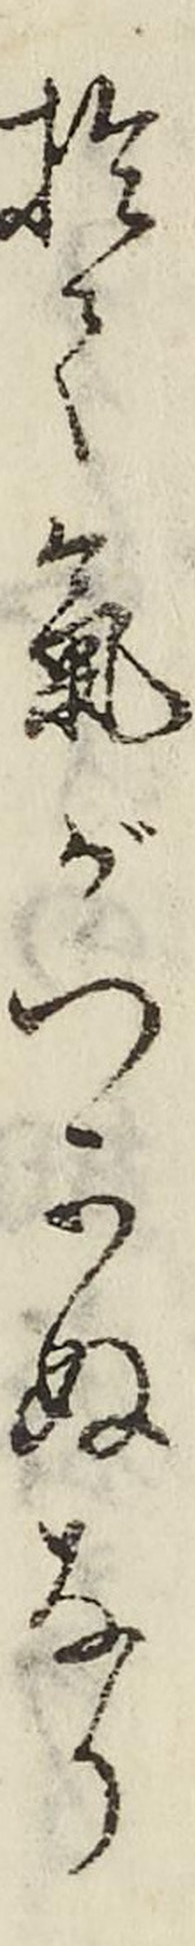於て気がつかぬなり
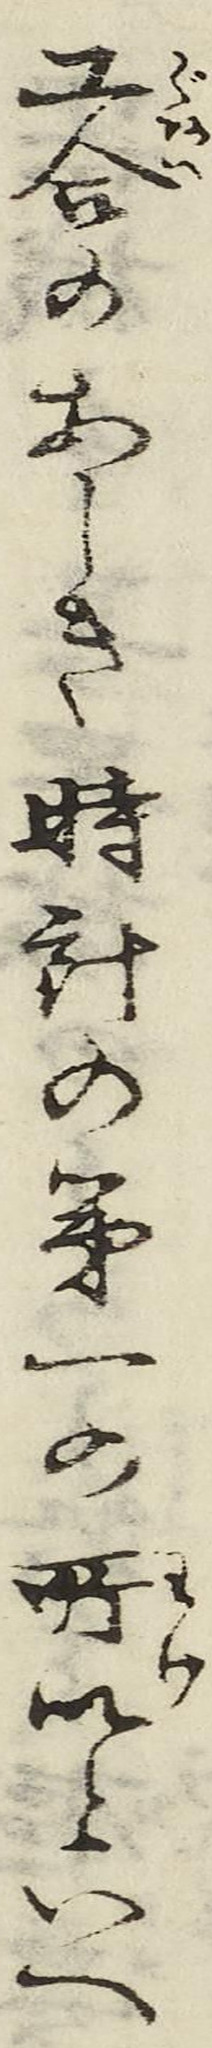工合のあしき時計の第一の所以といへ
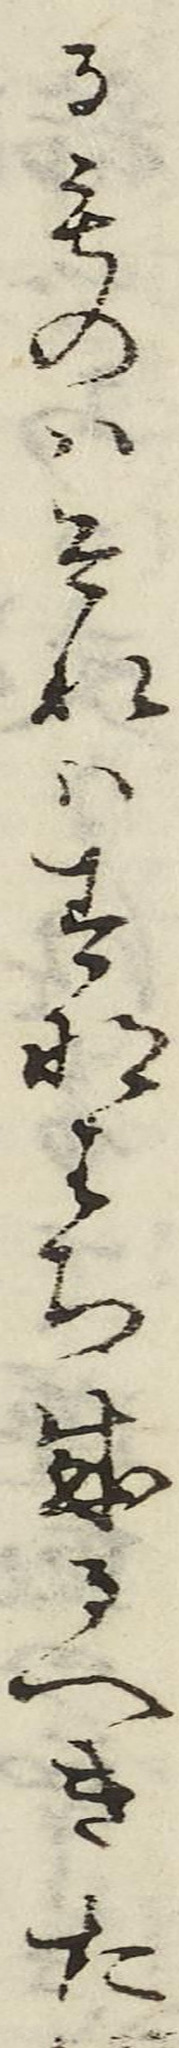るものはそれはすなはち成るへきた
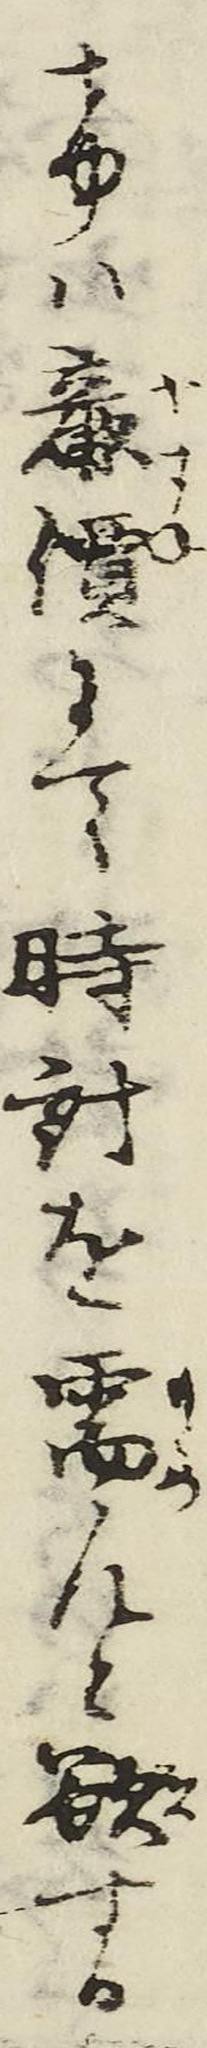けは廉価にて時計を需んと欲する
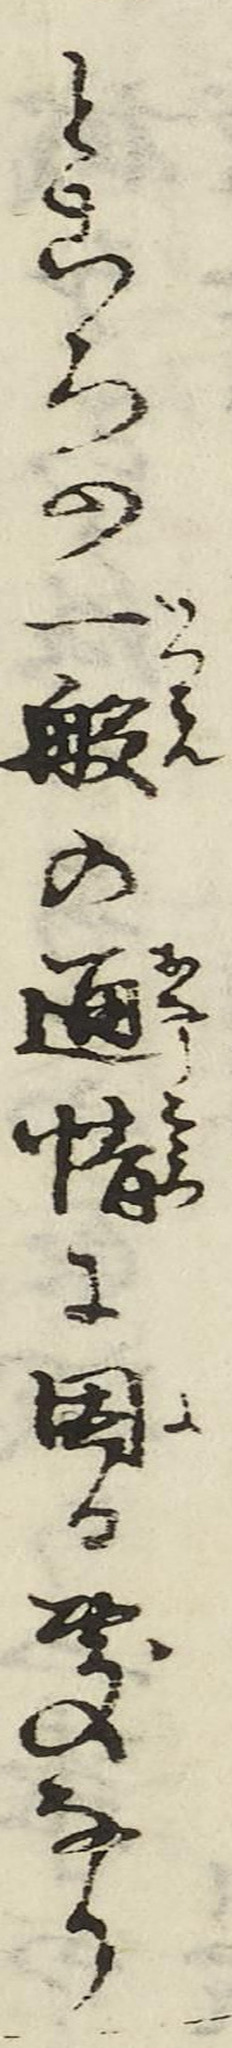ところの一般の通情に因る処なり
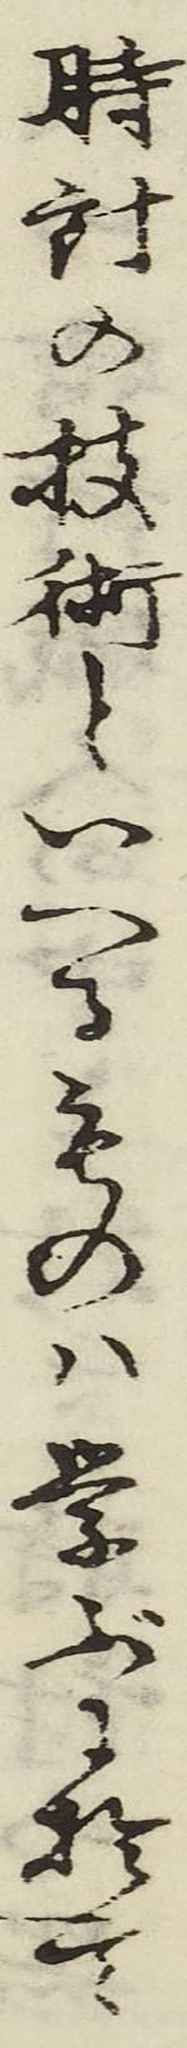時計の技術といへるものは学ぶに於て
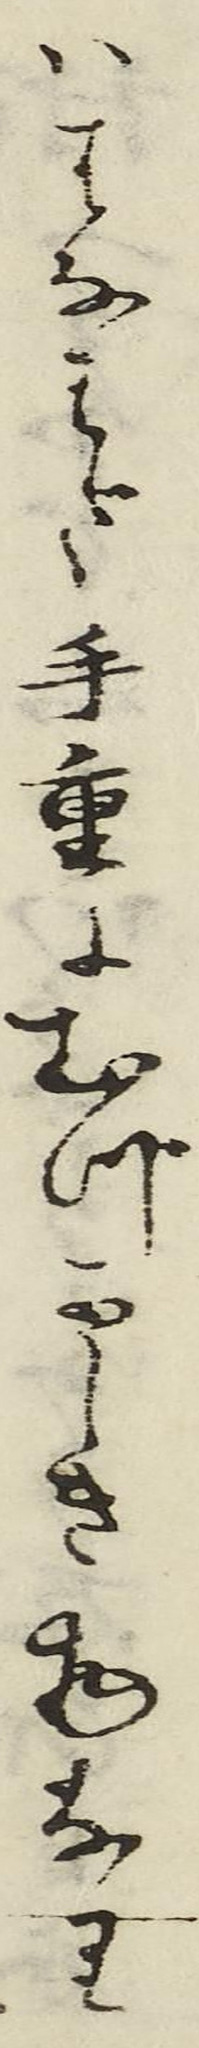ははなはだ手重にむづかしき物なり
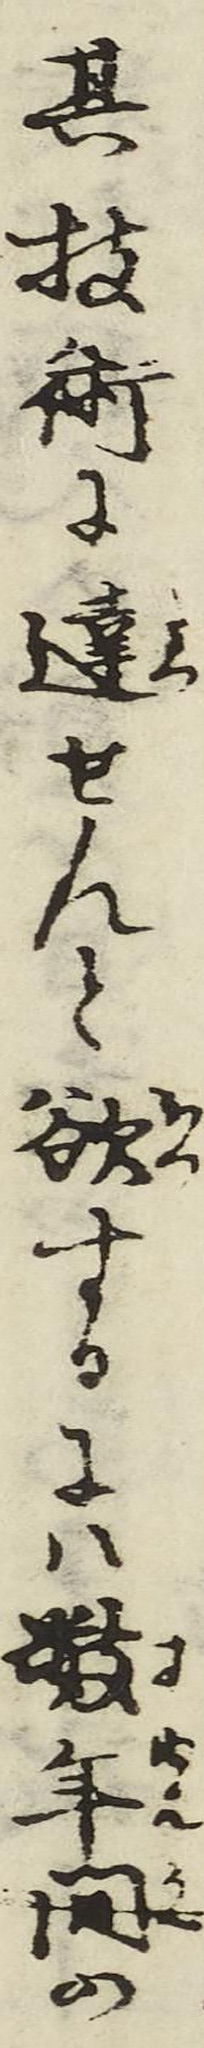其技術に達せんと欲するには数年間の
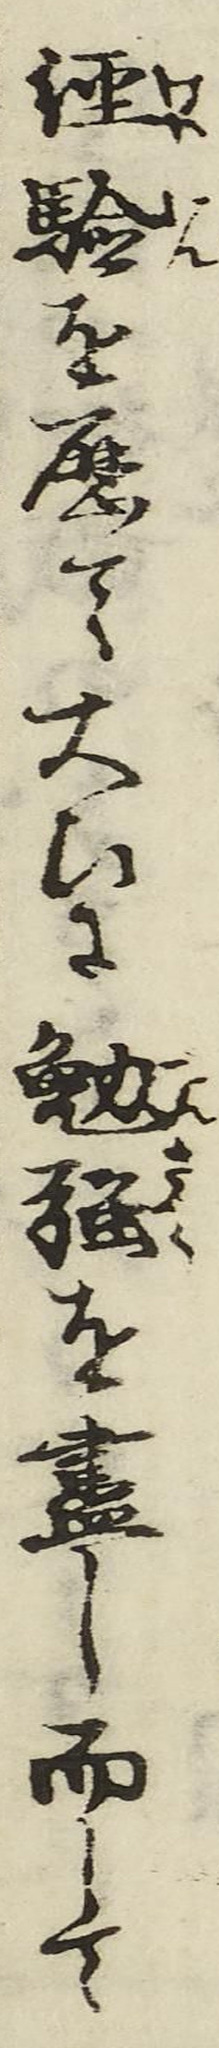経験を歴て大ひに勉強を尽し而して

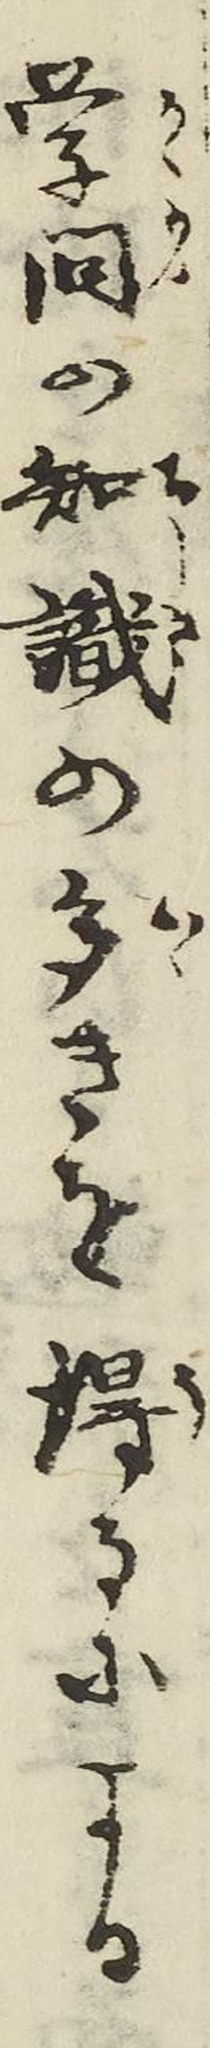学問の知識の多きを得るによる
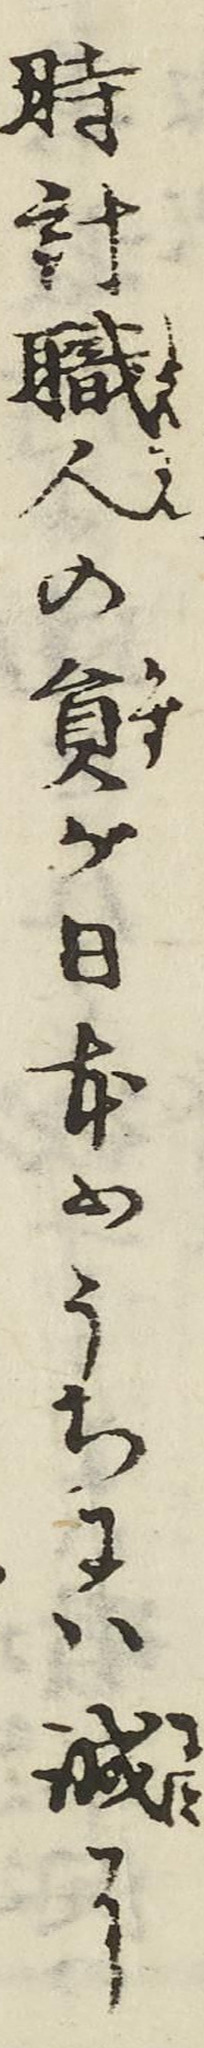時計職人の員が日本のうちには誠に
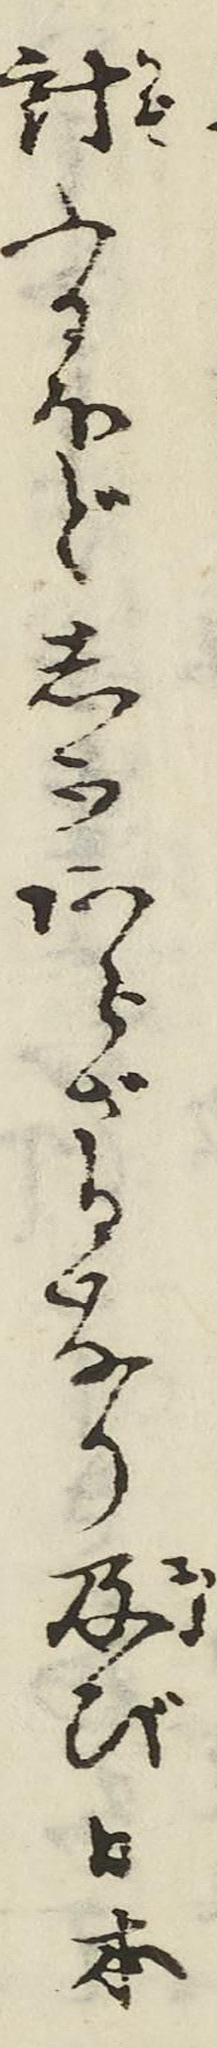計ふるほどしかあらざるなり及び日本
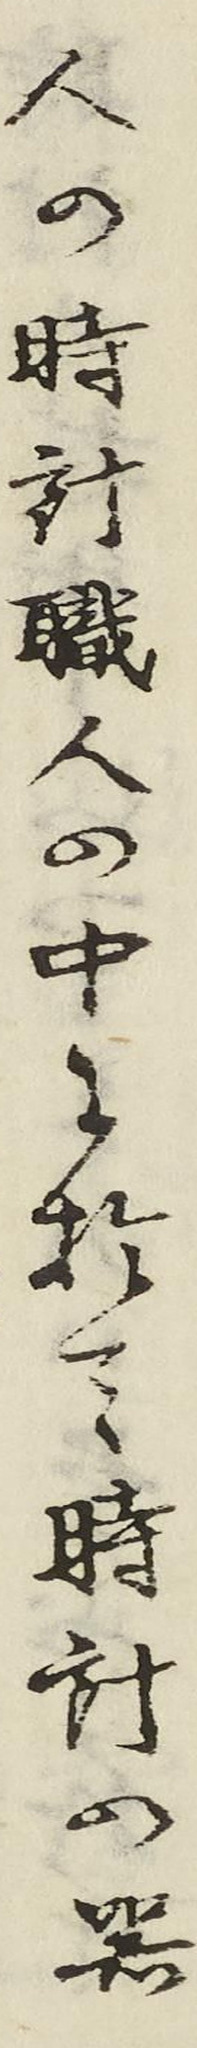人の時計職人の中に於て時計の器
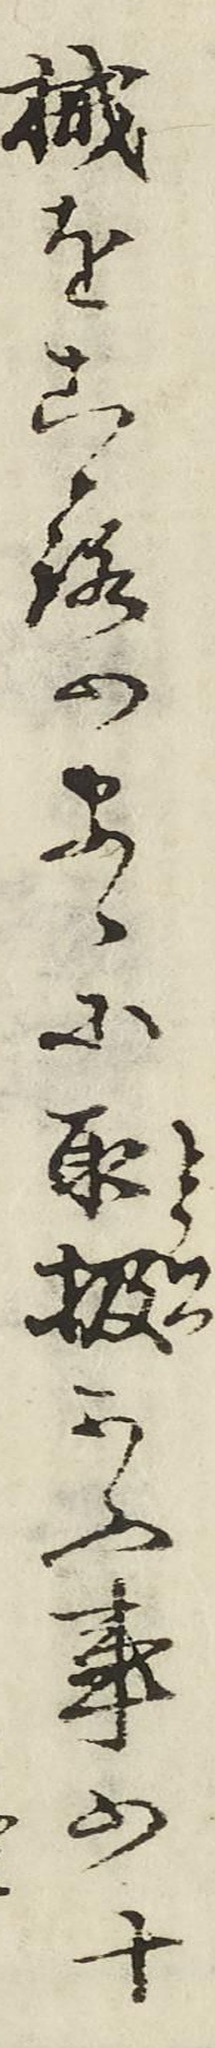械をこゝろのまゝに取扱かふ事の十
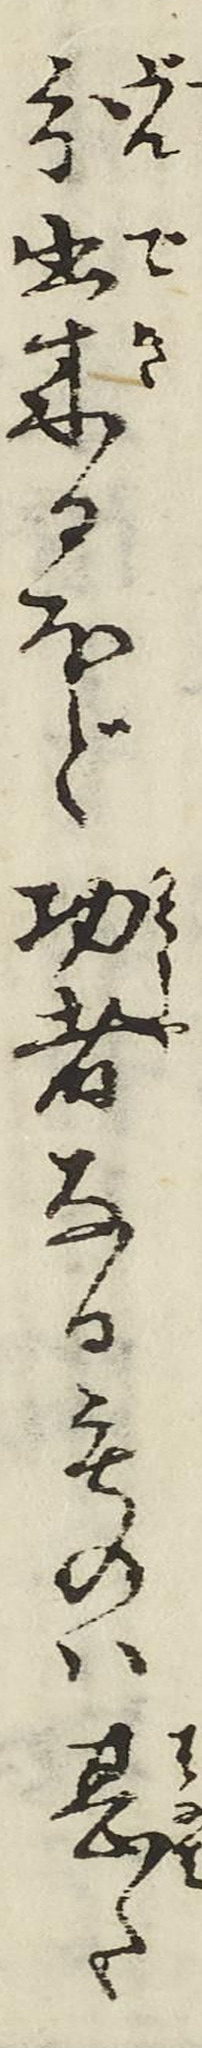分出来るほど巧者なるものは甚た
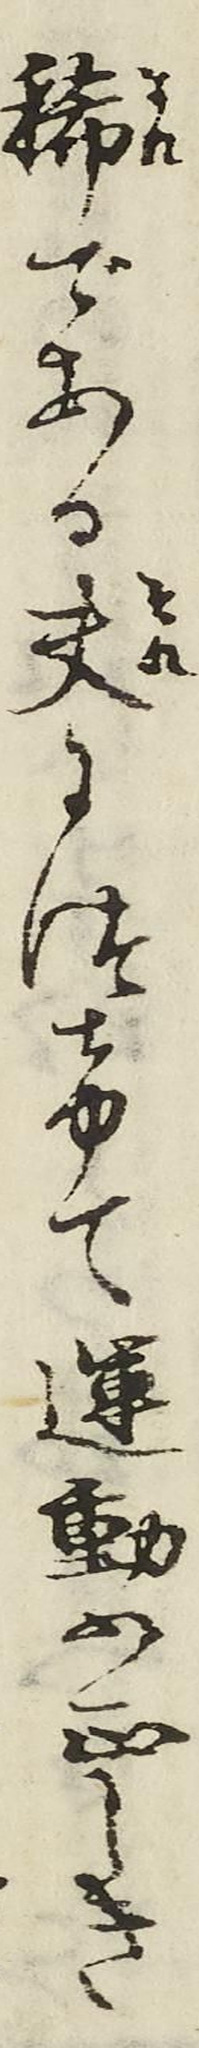稀である夫につけて運動の正しき
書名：[時計に関する冊子]
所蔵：東京大学地震研究所図書室 Earthquake Research Institute Library, The University of Tokyo, JAPAN
